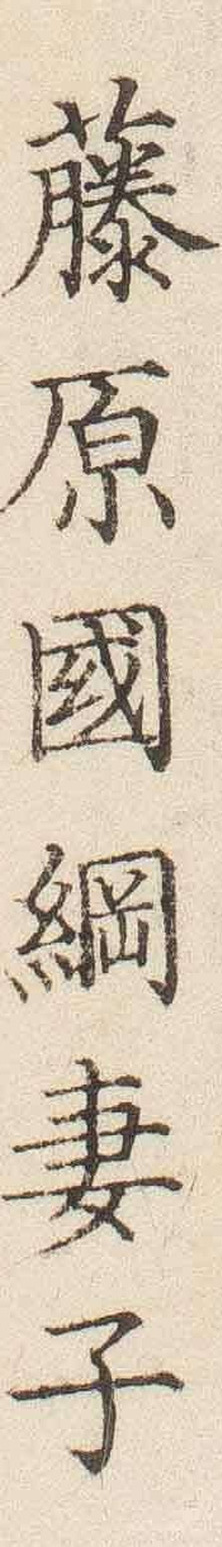藤原有房妻子
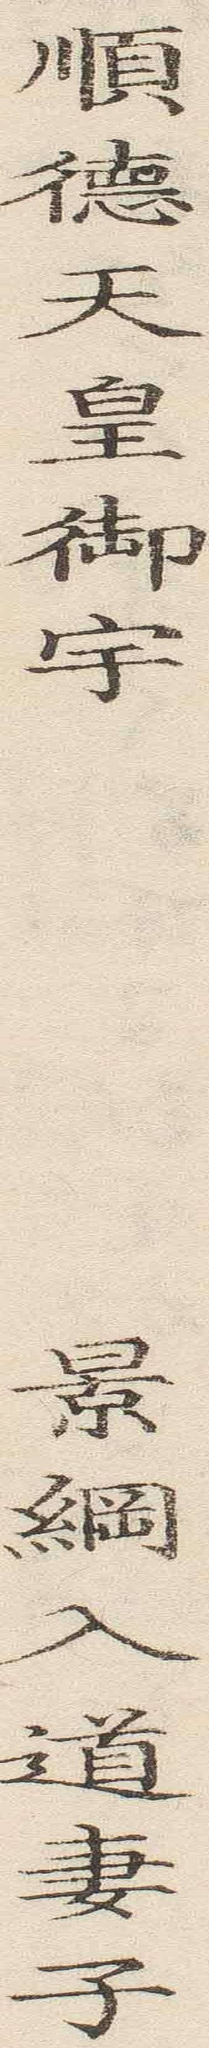順德天皇御宇影綱入道妻子
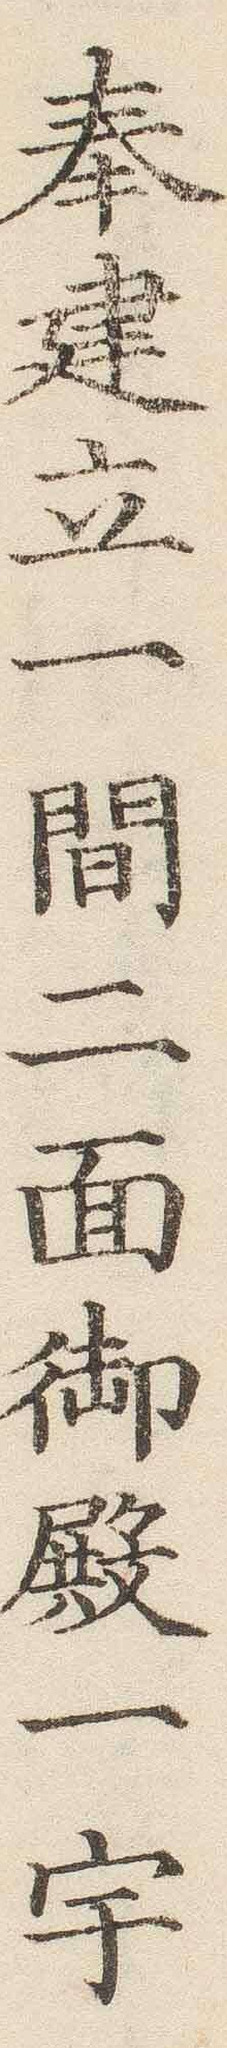奉建立一間二面御殿一宇
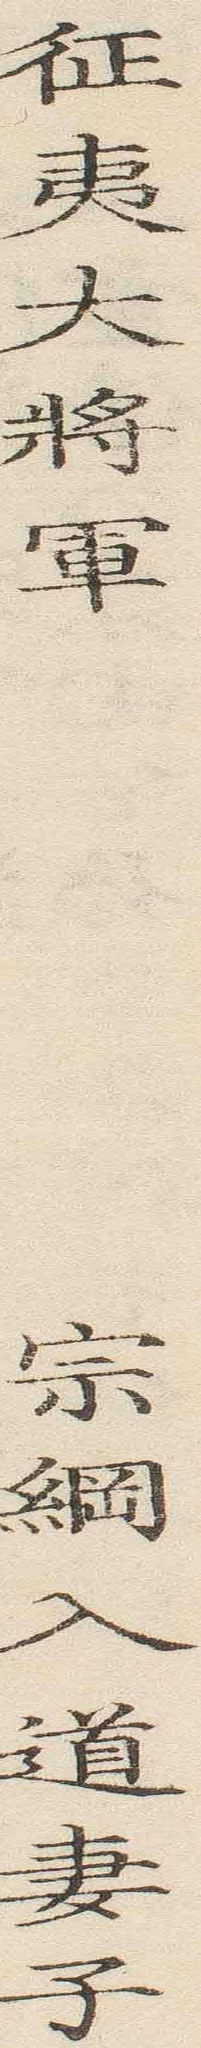征夷大將軍宗綱入道妻子
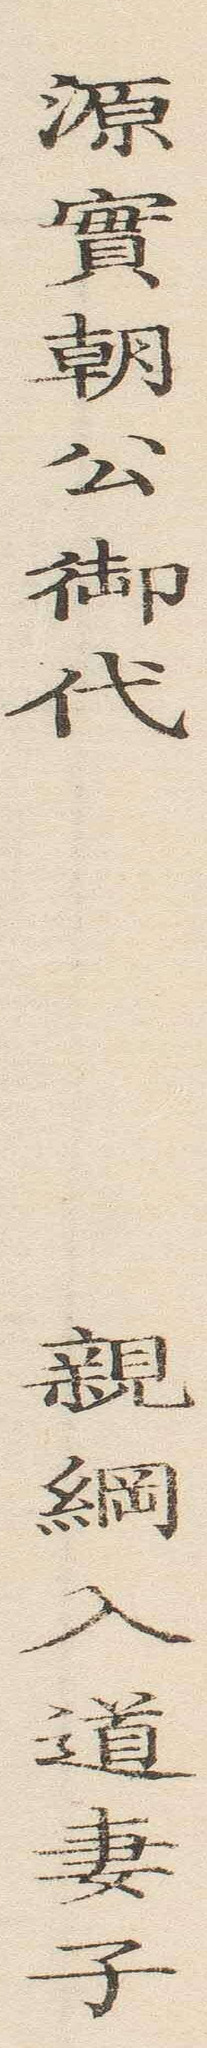源實朝公御代親綱入道妻子
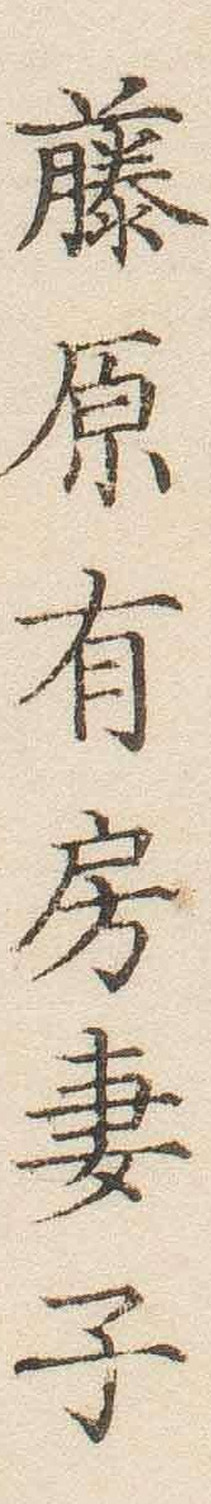藤原有房妻子
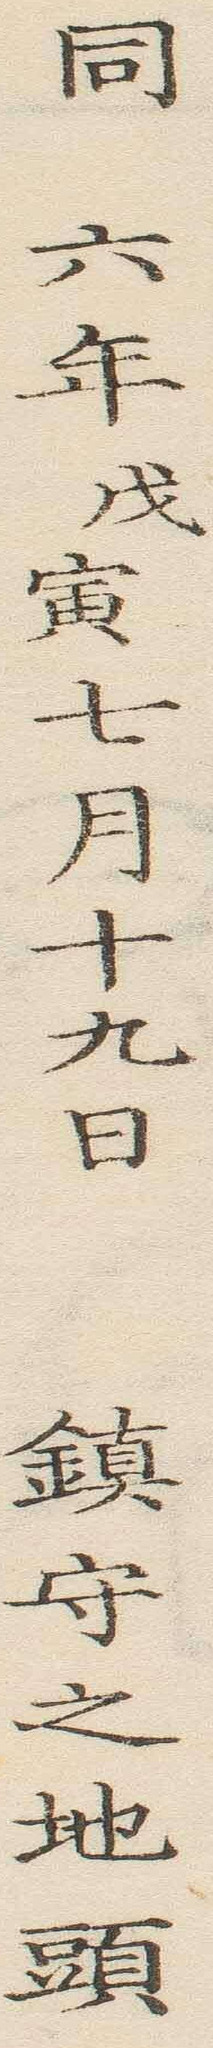同六年戊寅七月十九日鎮守之地頭
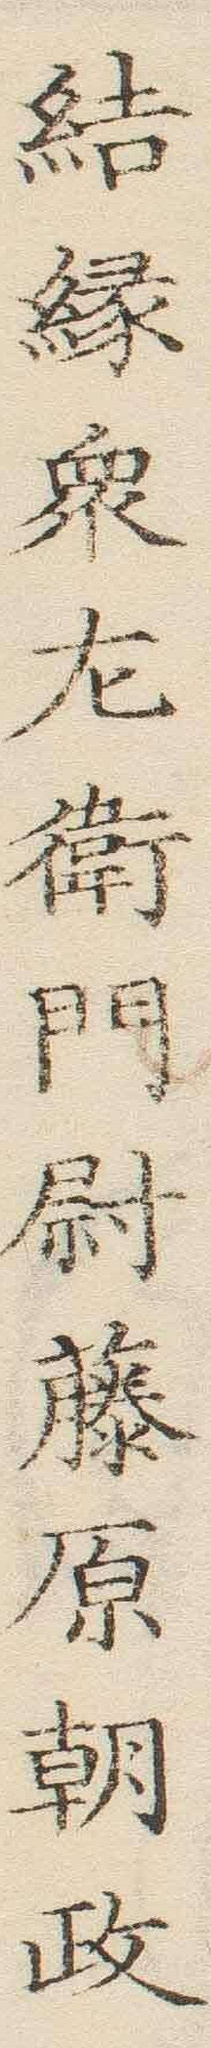結縁衆㔫衛門尉藤原朝政
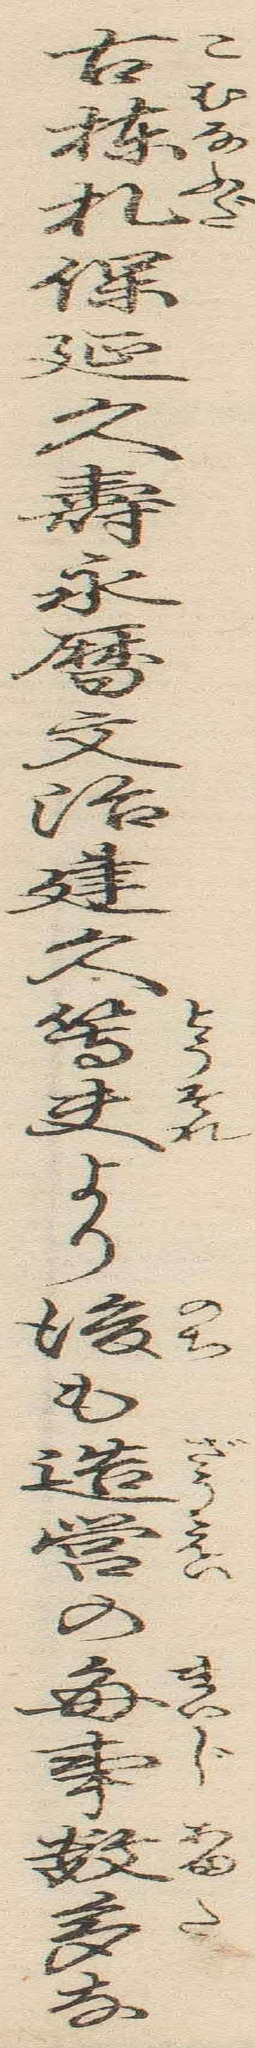古棟札保延久壽永歴文治建久等夫より後も造営の毎事数多な
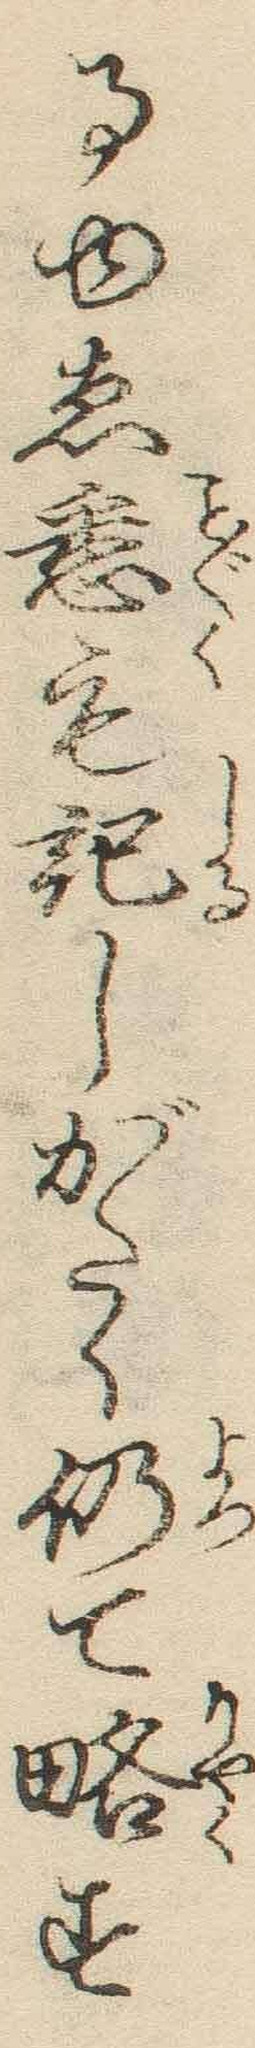るゆゑ悉も記しがたく仍て略す

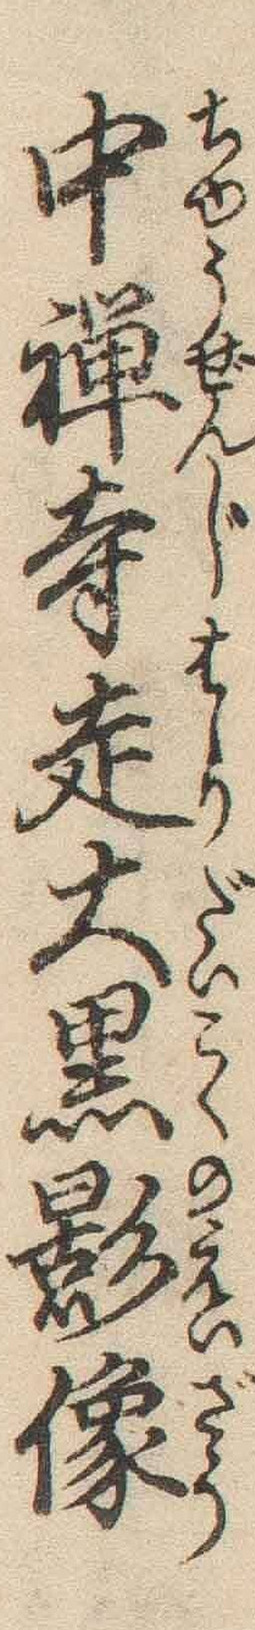中禅寺走大黒影像
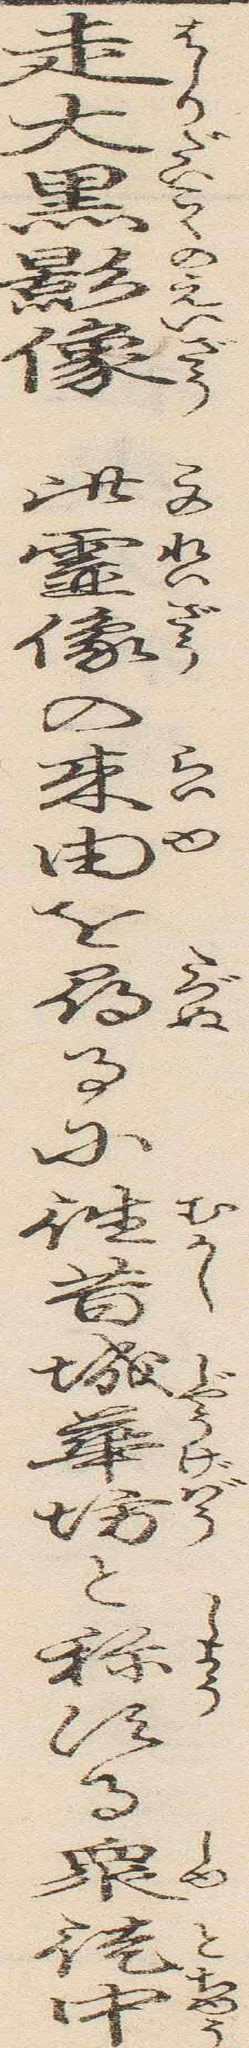走大黒影像此靈像の來由を尋るに徃昔城蕐坊と称する衆徒中
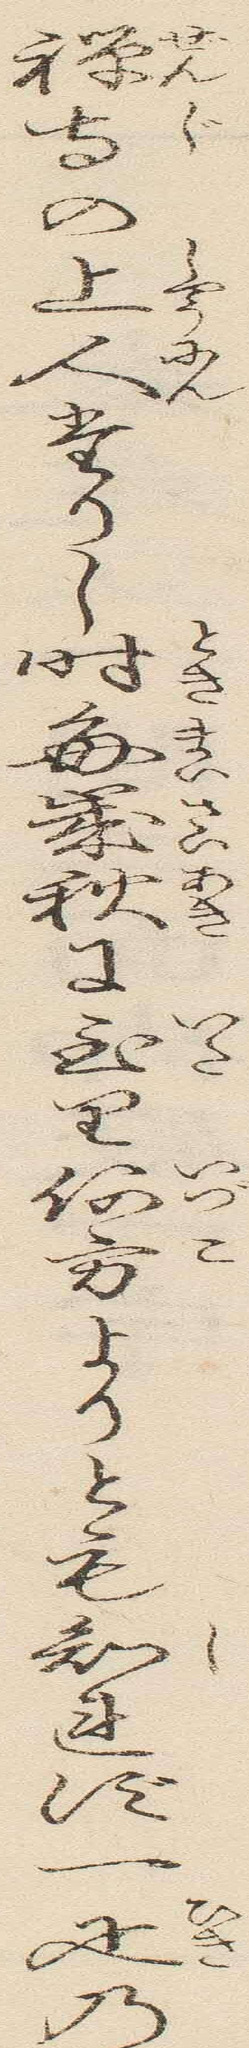禅寺の上人たりし时毎歳秋に至り何方よりとも知れず一疋の
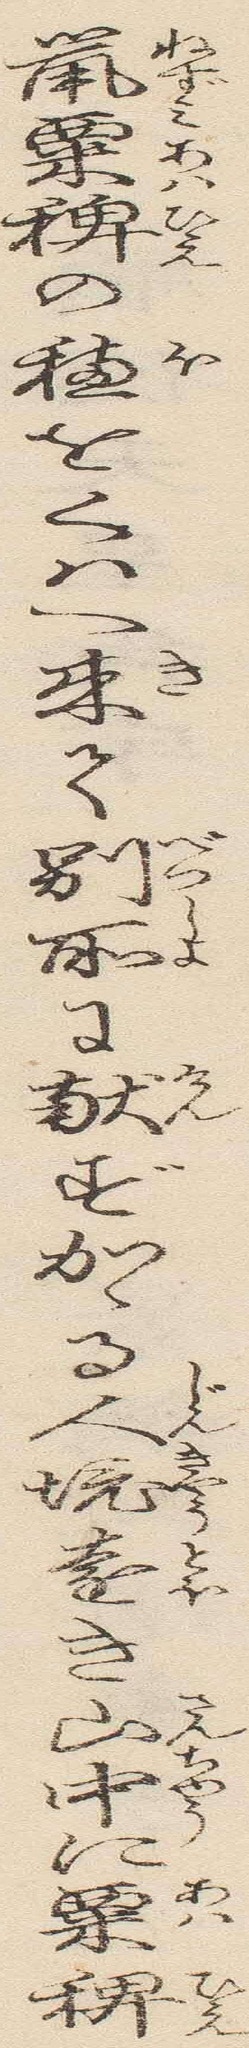鼠粟稗の穂をくはへ來て別所に献ずかゝる人境遠き山中に粟稗
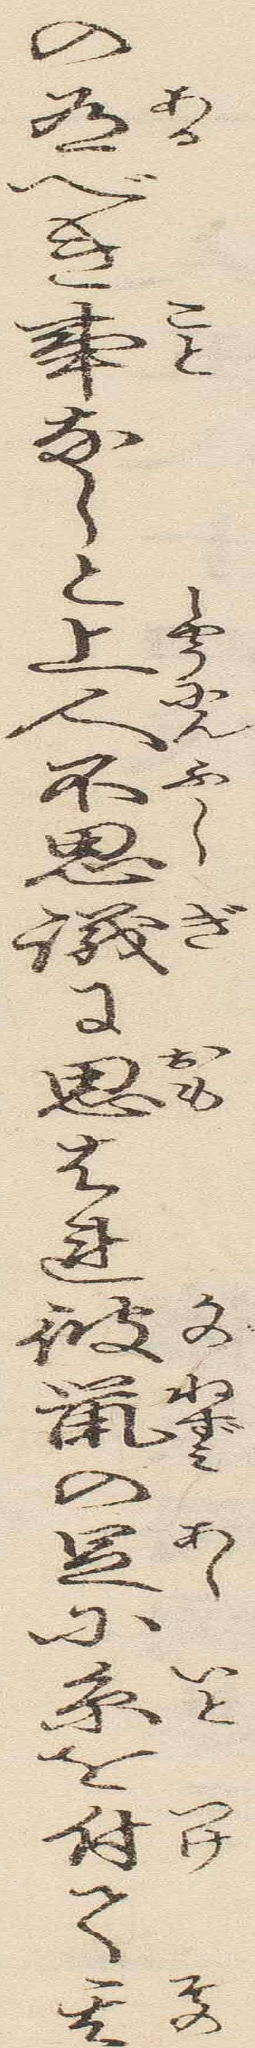の有べき事なしと上人不思議に思はれ彼鼠の足に糸を付て其
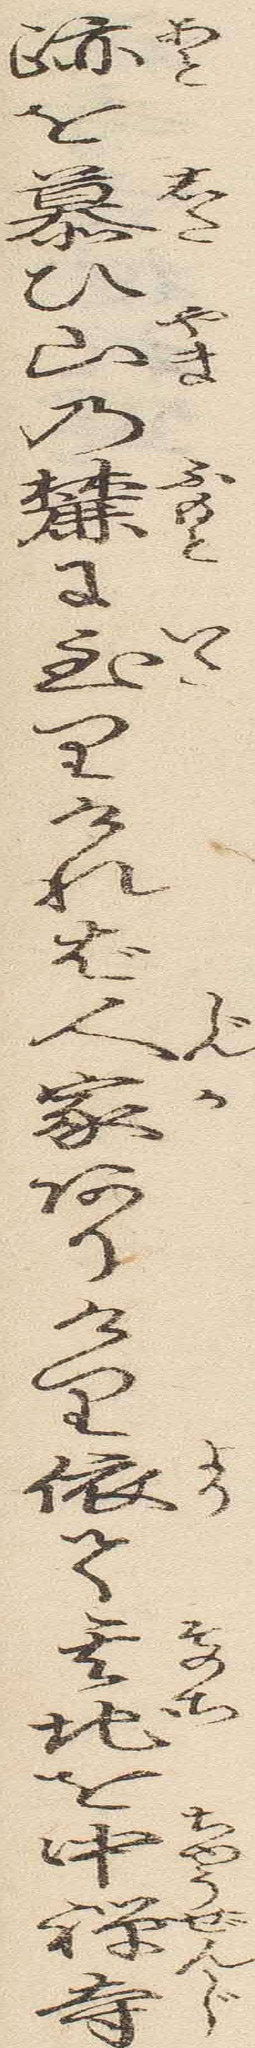跡を慕ひ山の麓に至りければ人家ありけり依て其地を中禅寺
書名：日光山志
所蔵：東京学芸大学附属図書館 国文学研究資料館
